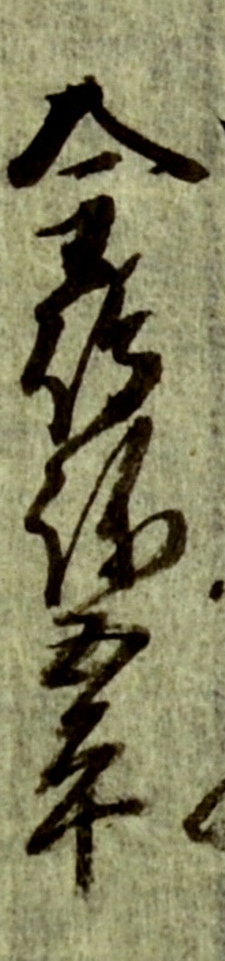金嶋弥五平
